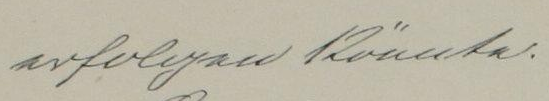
erfolgen könnte.
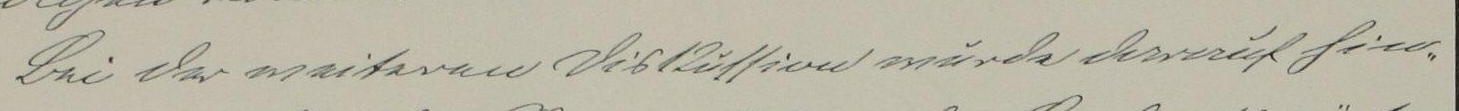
Bei der weiteren Diskussion wurde darauf hin-
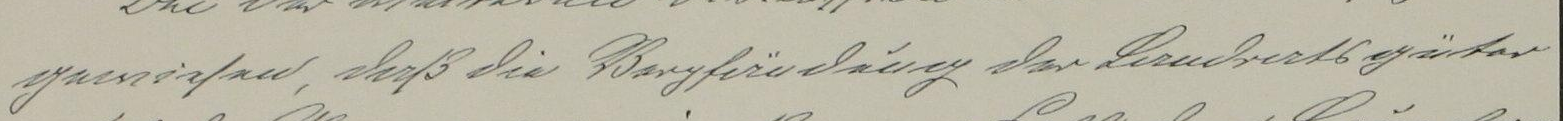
gewiesen, daß die Verpfändung der Landratsgüter
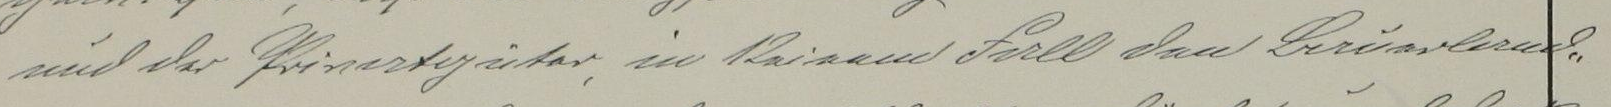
und der Privatgüter, in keinem Fall den Bauerland-
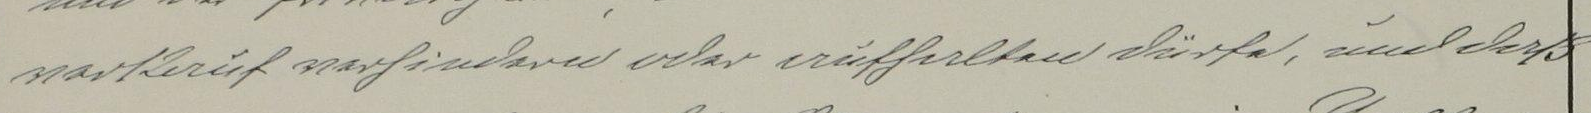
verkauf verhindern oder aufhalten dürfe, und daß
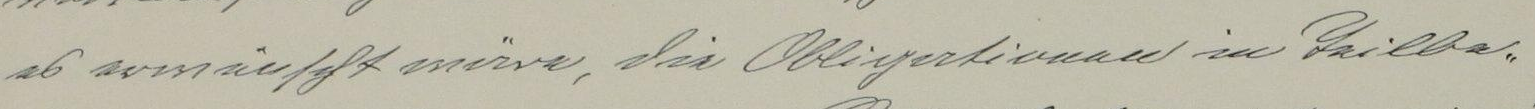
es erwünscht wäre, die Obligationen in Teilbe-
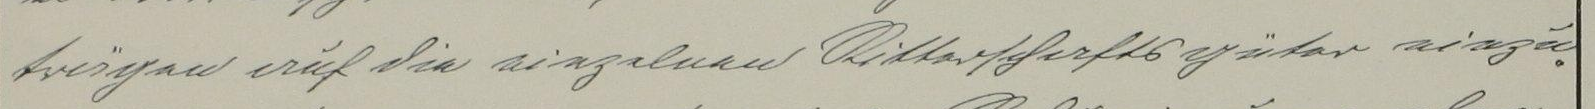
trägen auf die einzelnen Ritterschaftsgüter einzu-
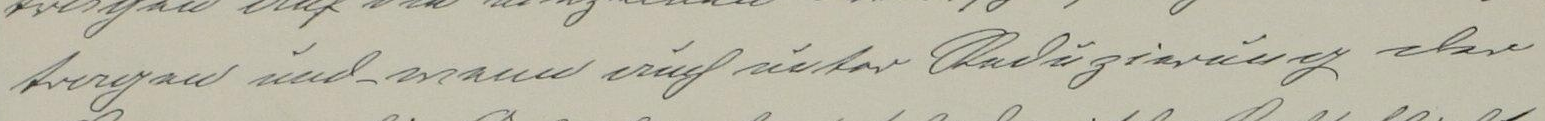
tragen und – wenn auch unter Reduzierung der
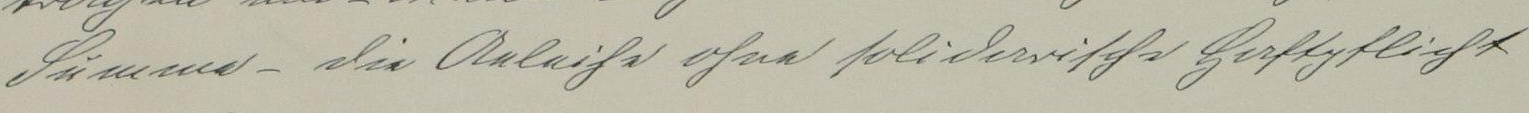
Summe – die Anleihe ohne solidarische Haftpflicht
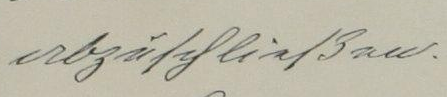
abzuschließen.
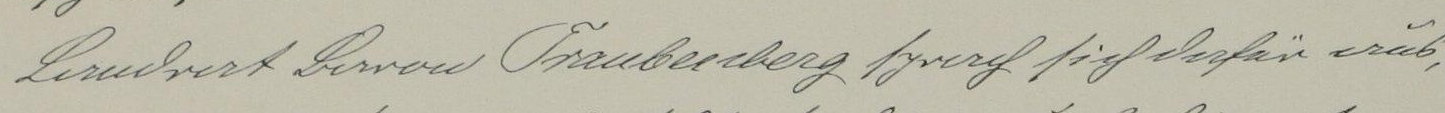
Landrat Baron Traubenberg sprach sich dafür aus,
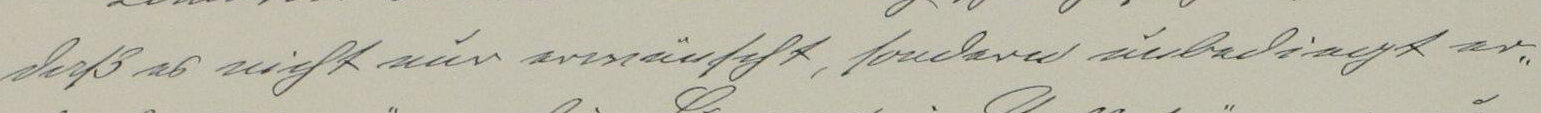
daß es nicht nur erwünscht, sondern unbedingt er-
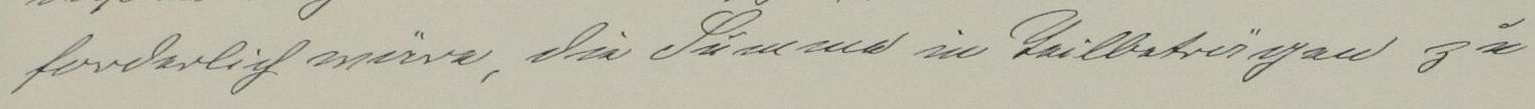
forderliche wäre, die Summe in Teilbeträgen zu
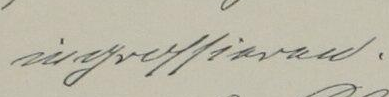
ingrossieren.
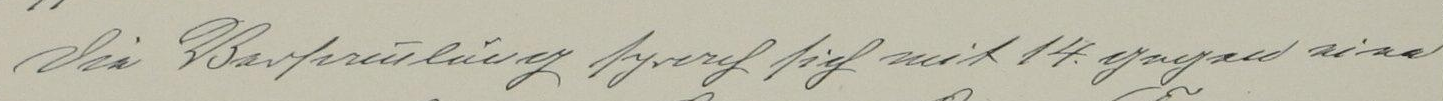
Die Versammlung sprach sich mit 14 gegen eine
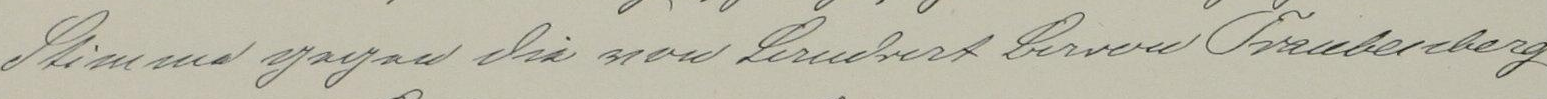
Stimme gegen die von Landrat Baron Traubenberg
